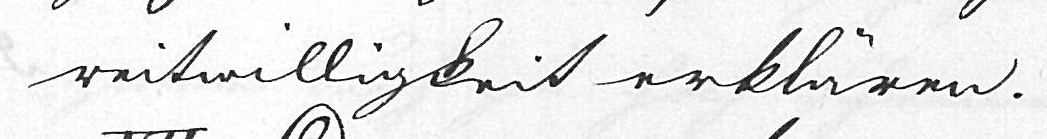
reitwilligkeit erklären.
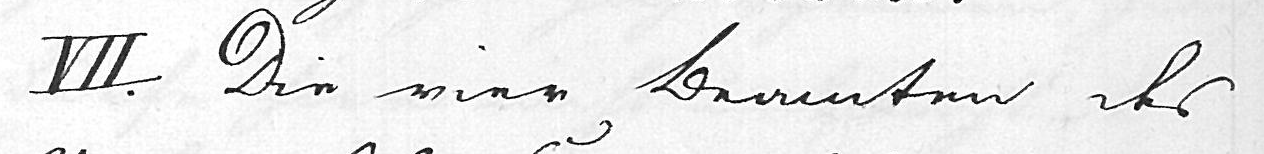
VII. Die vier Beamten des
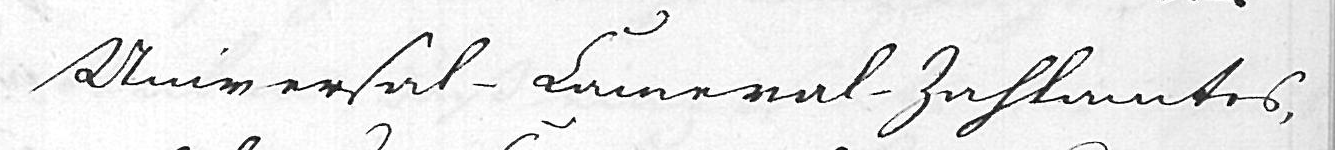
Universal-Cameral-Zahlamtes,
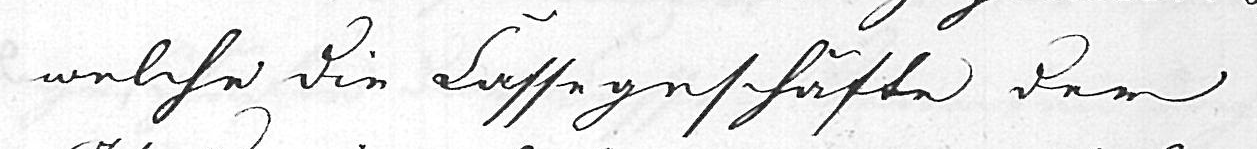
welche die Cassegeschäfte der
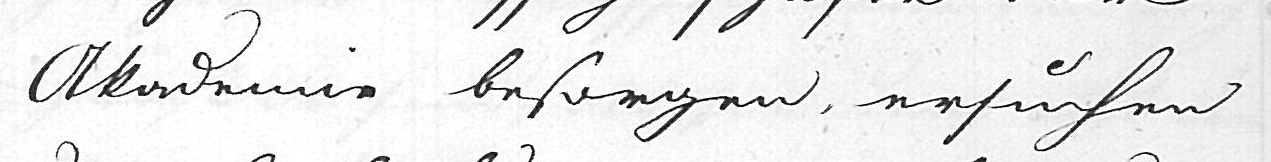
Akademie besorgen, ersuchen
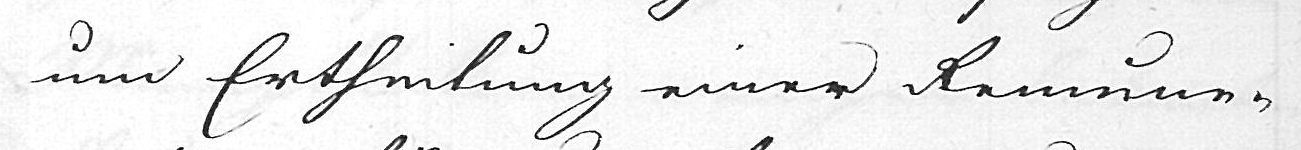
um Ertheilung einer Remune-
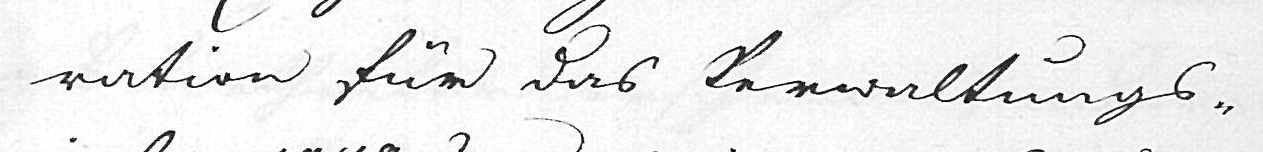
ration für des Verwaltungs-
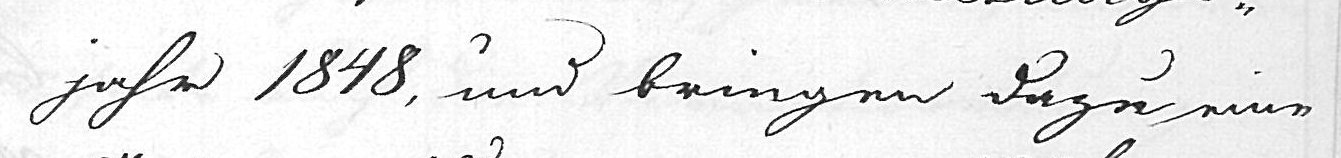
jahr 1848, und bringen dazu eine
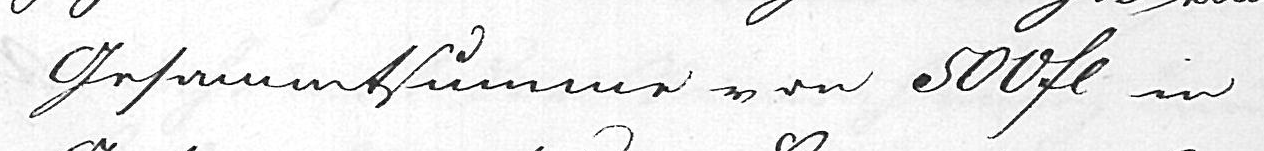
Gesammtsumme von 500 fl in
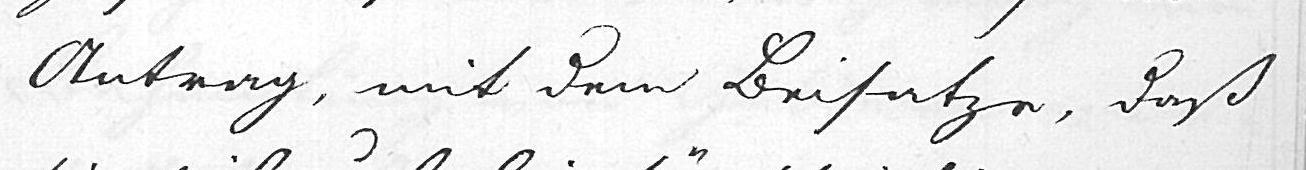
Antrag, mit dem Beisatze, daß
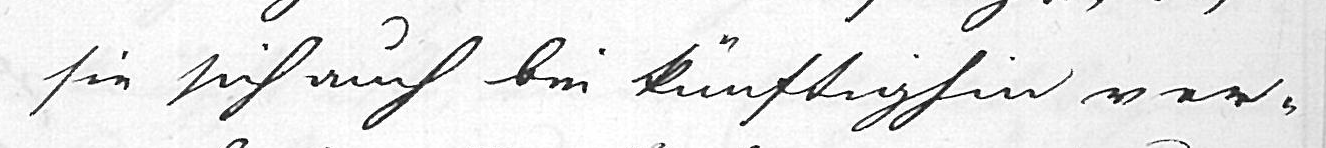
sie sich auch der künftighin ver-
